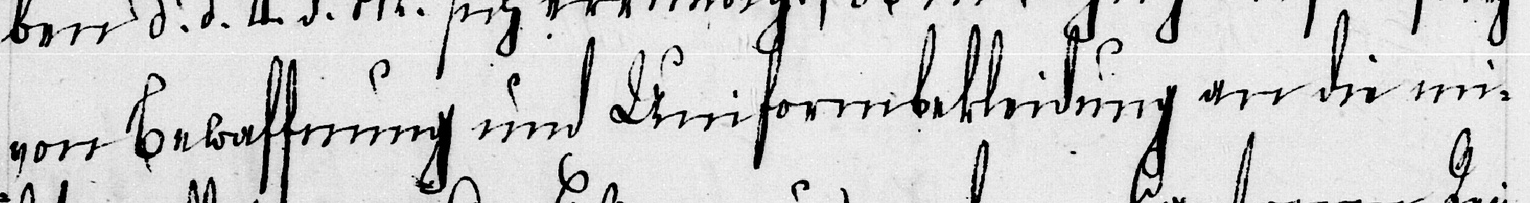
von Bewaffnung und Uniformbekleidung an die mi¬
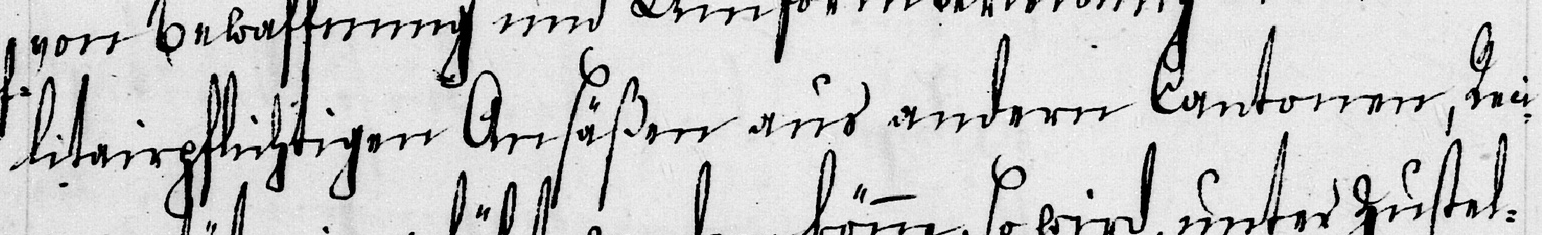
litairpflichtigen Ansäßen aus andern Cantonen, Reci¬
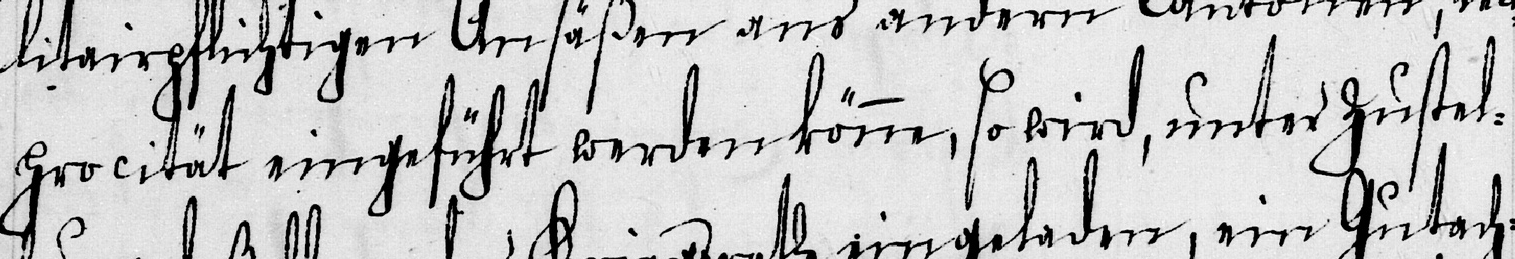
procität eingeführt werden könne, so wird, unter Zustel¬
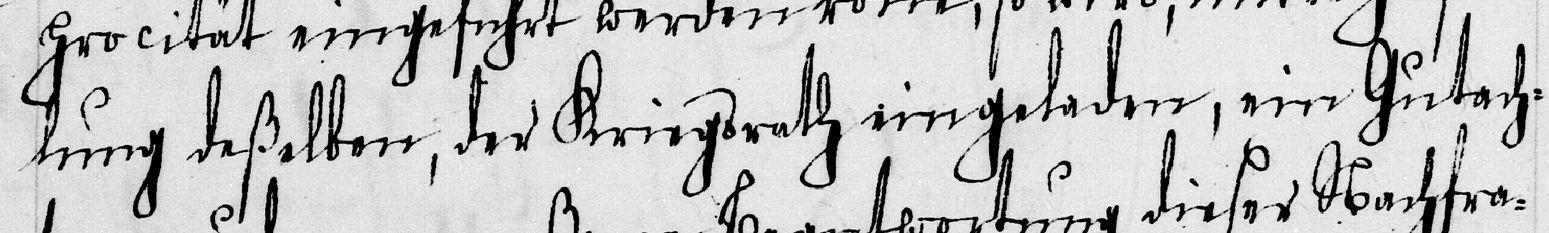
lung deßelben, der Kriegsrath eingeladen, ein Gutach¬
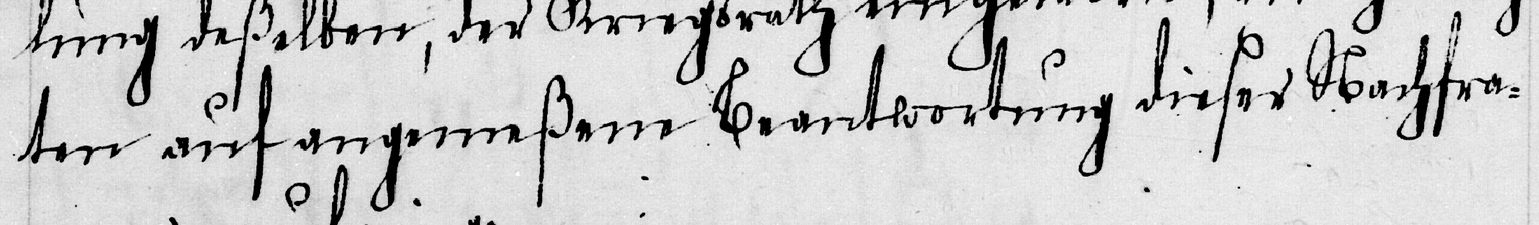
ten auf angemeßene Beantwortung dieser Nachfra¬
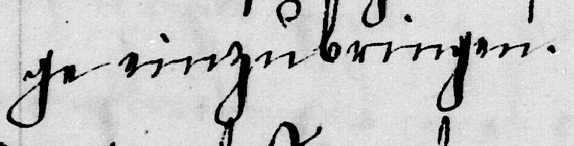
ge einzubringen.
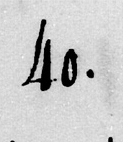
4.
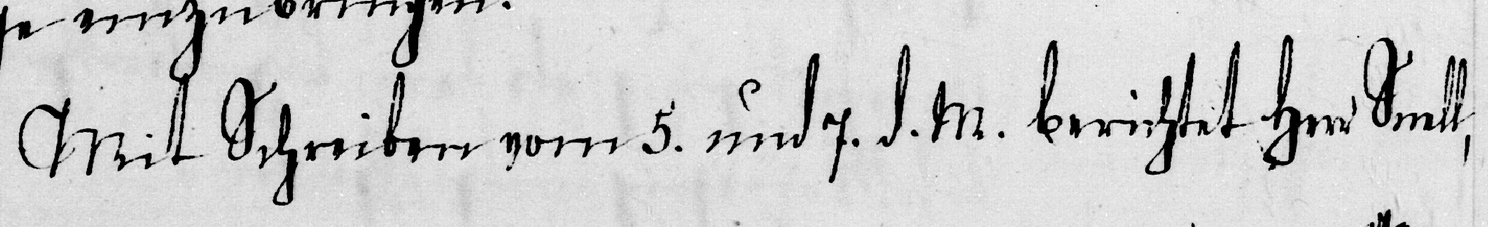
Mit Schreiben vom 5. und 7. d. M. berichtet Herr Snel¬
